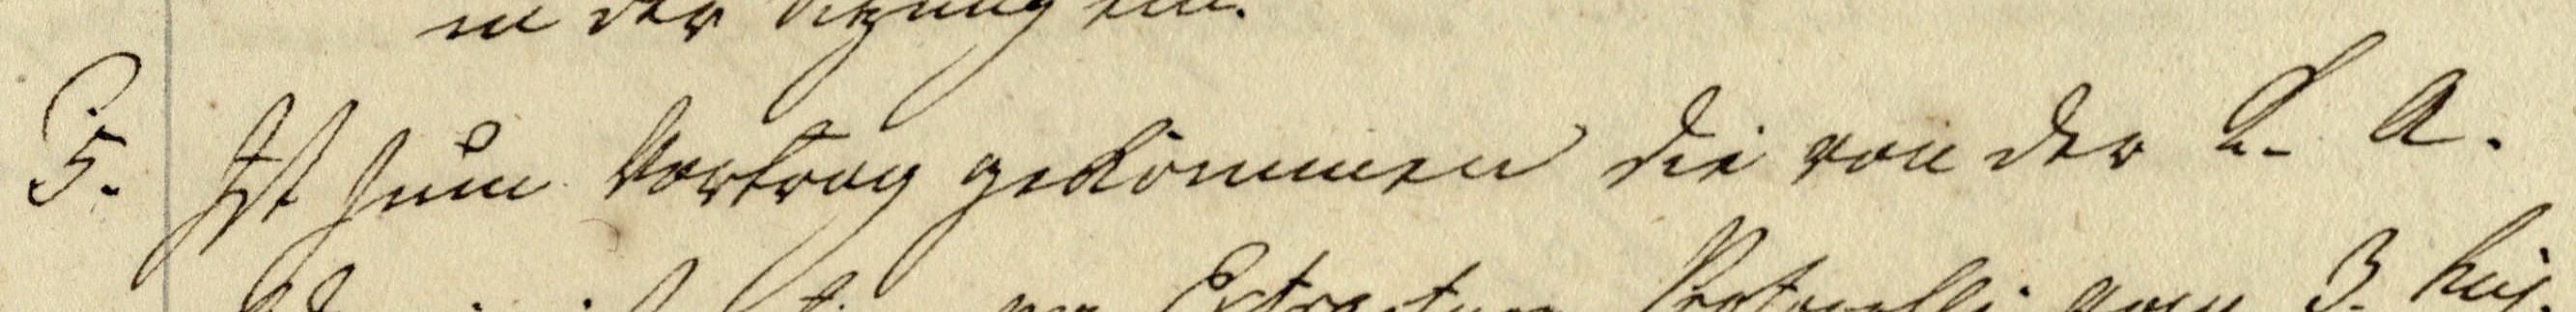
5. Ist zum Vortrag gekommen die von der K. A.
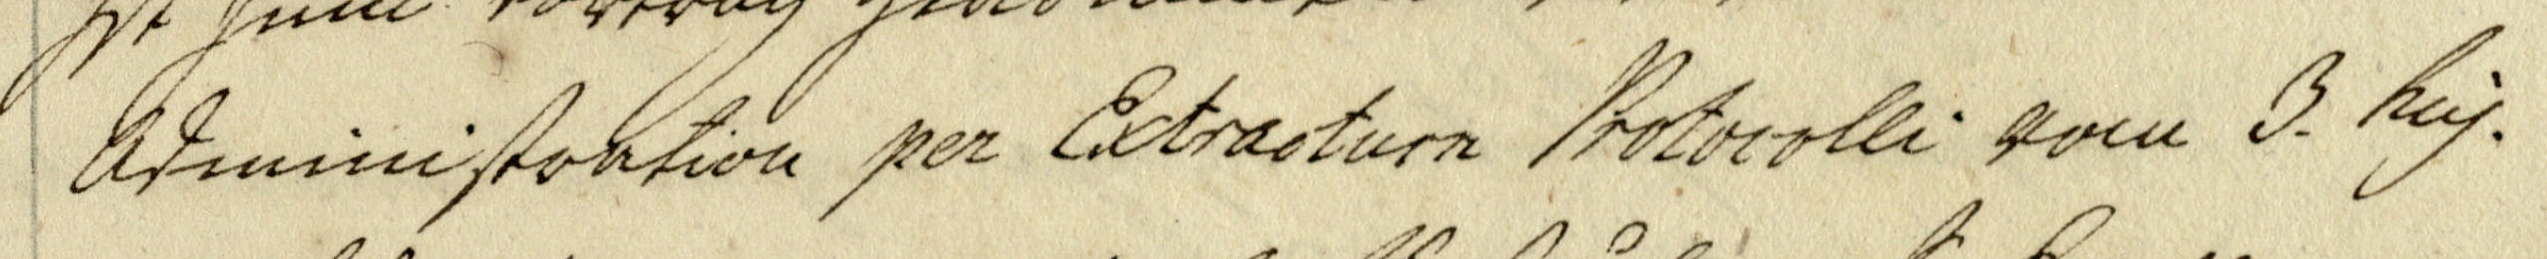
Administration per Extractum Protocolli vom 3. huj.
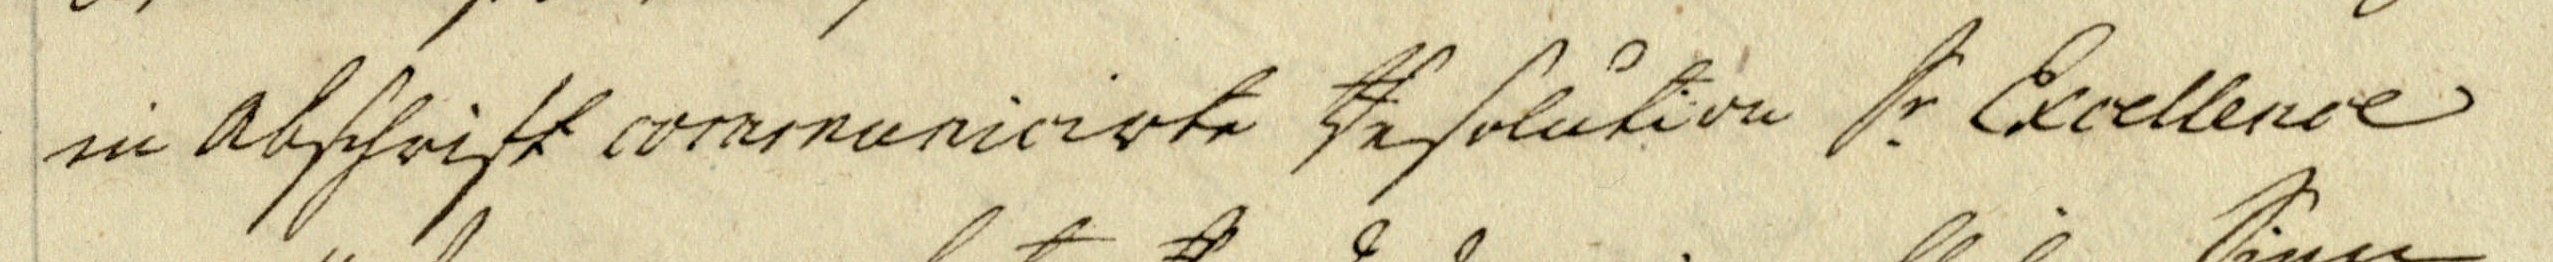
in Abschrift communicirte Resolution Sr Excellence
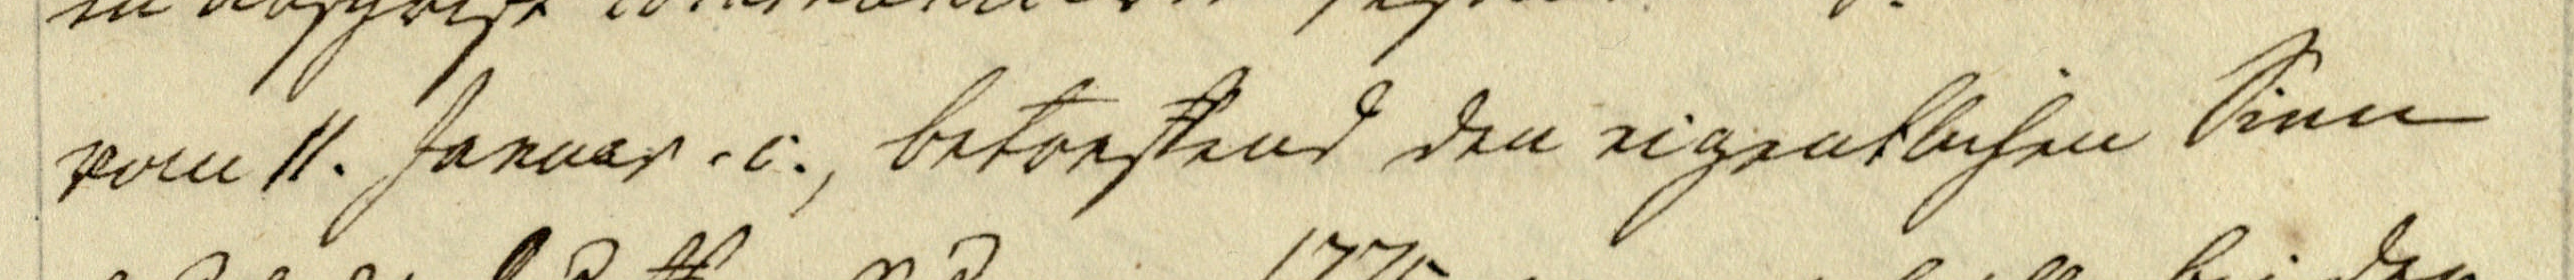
vom 11. Januar c., betreffend den eigentlichen Sinn
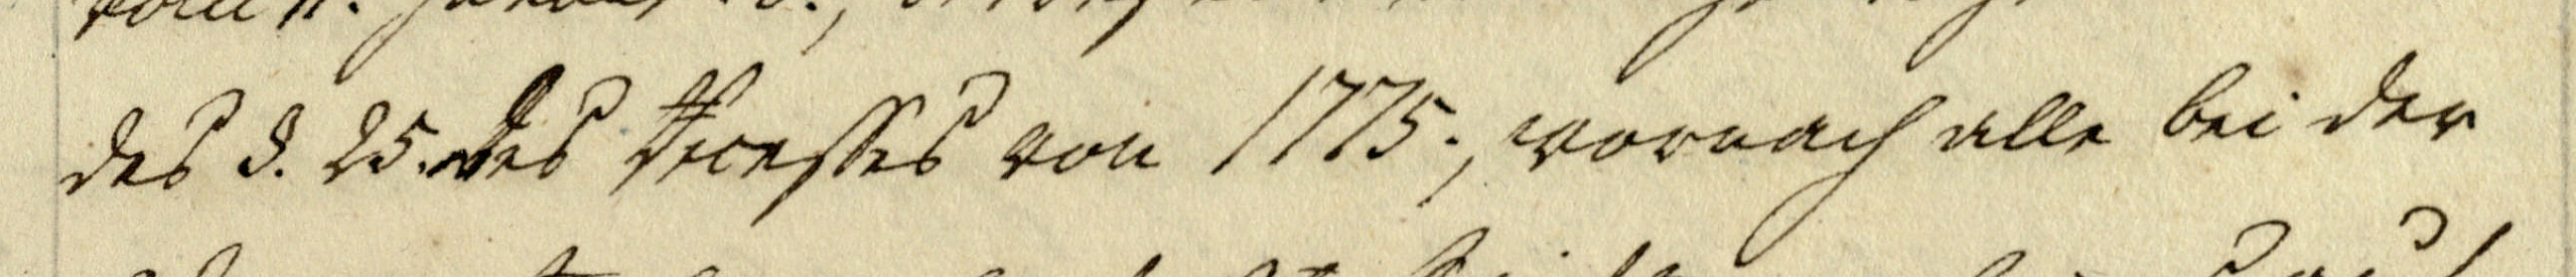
des §. 25 des Recesses von 1775., wornach alle bei der
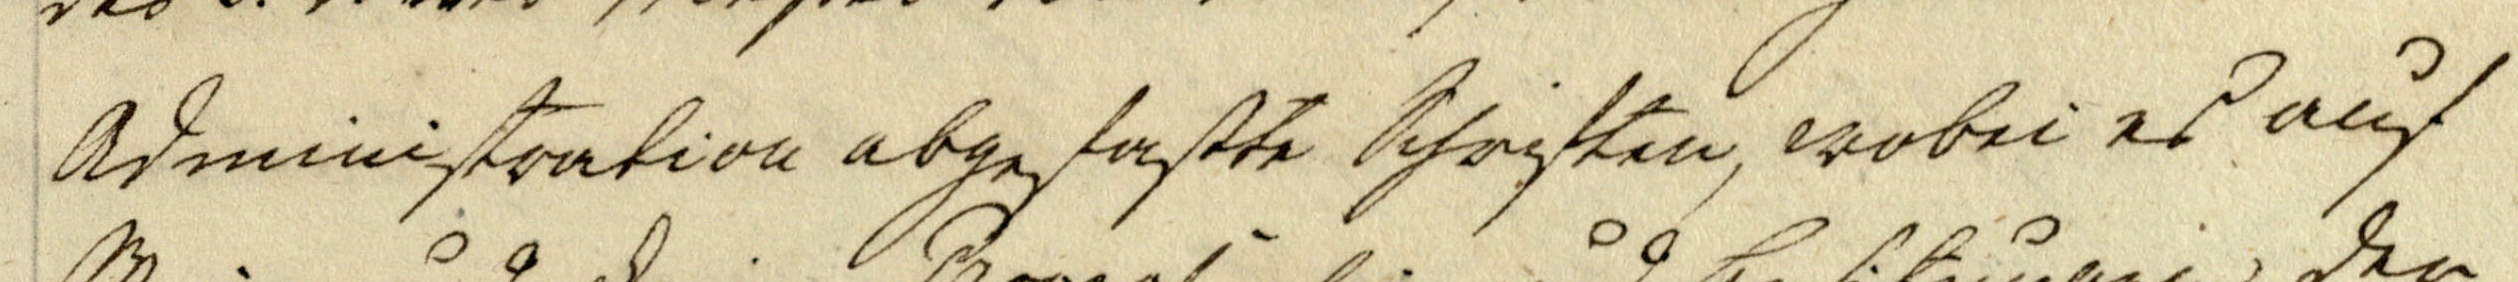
Administration abgefaßte Schriften, wobei es auf
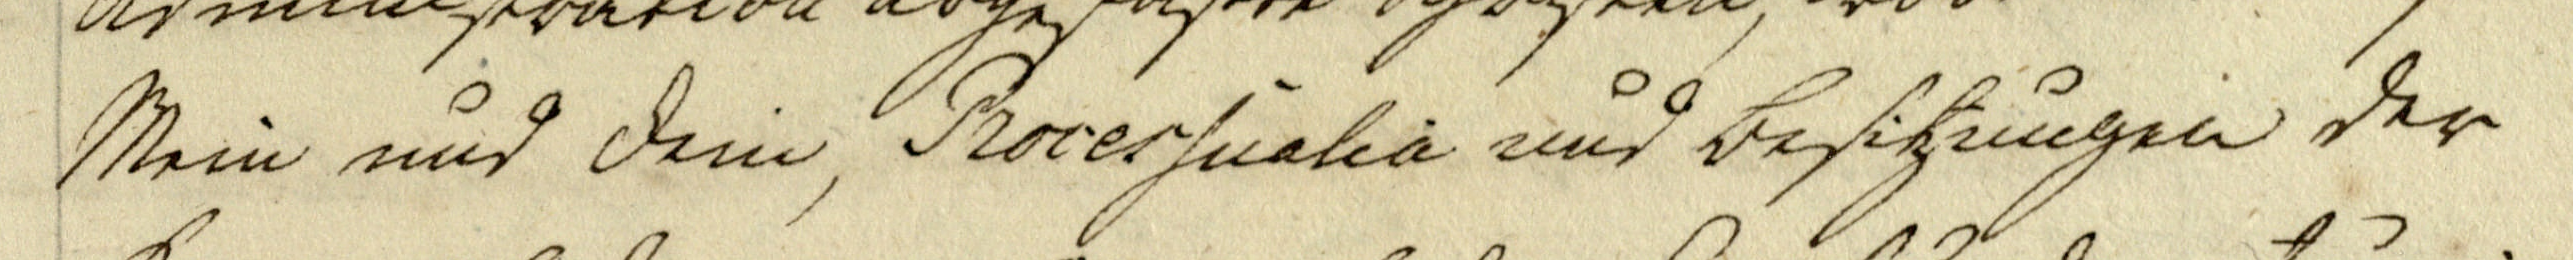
Mein und Dein, Processualia und Besitzungen der
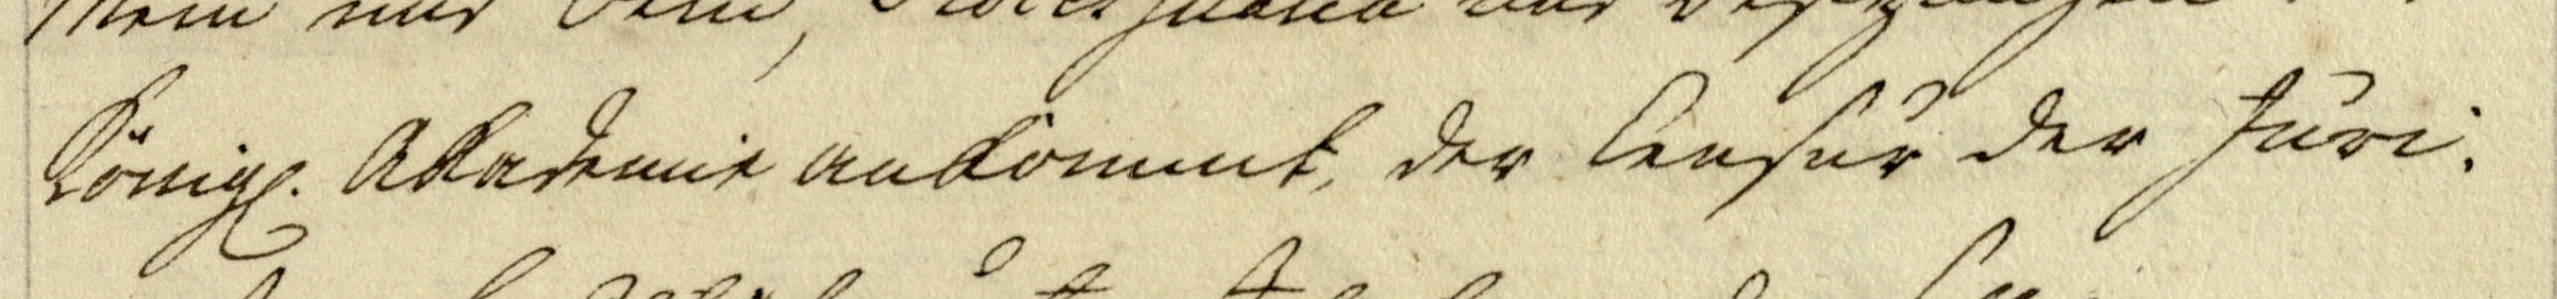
Königl. Akademie ankommt, der Censur der Juri¬
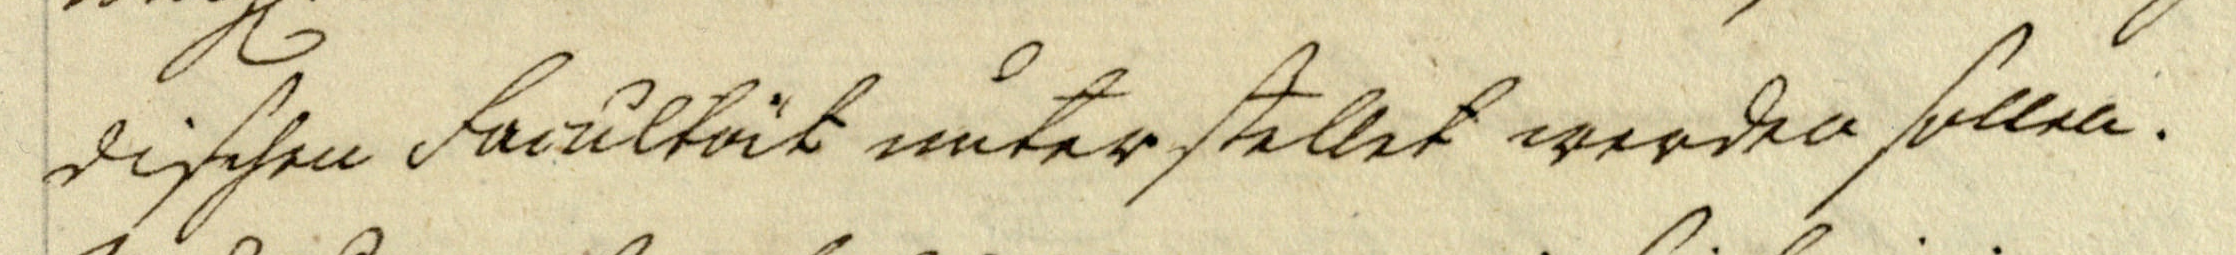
dischen Facultät unterstellet werden sollen.
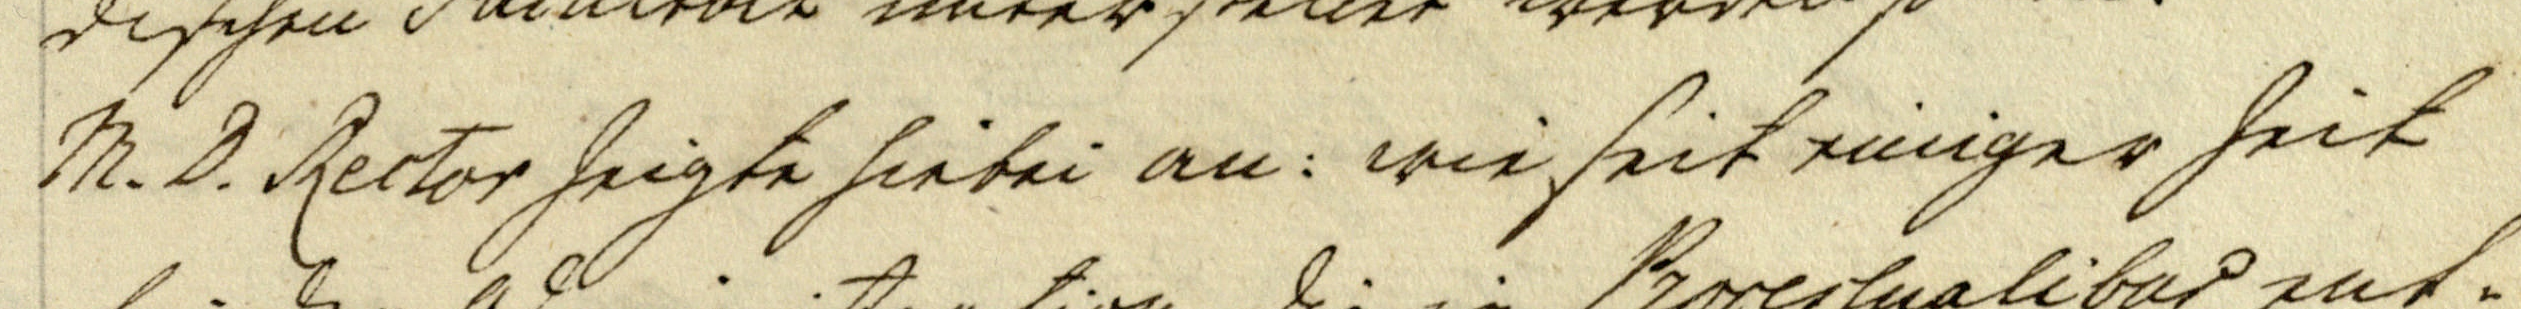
M. D. Rector zeigte hiebei an: wie seit einiger Zeit
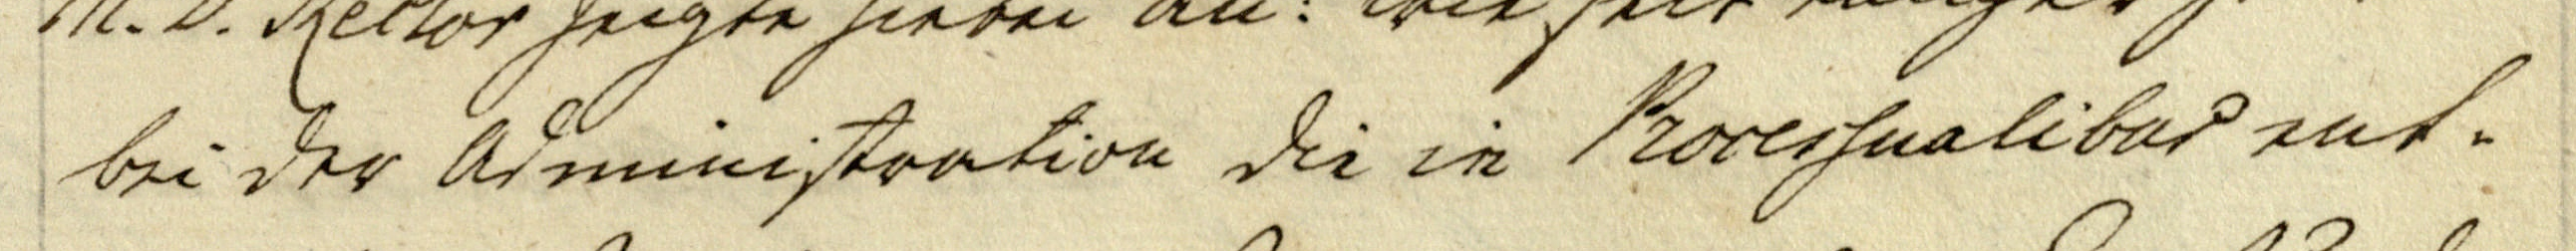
bei der Administration die in Processualibus ent¬
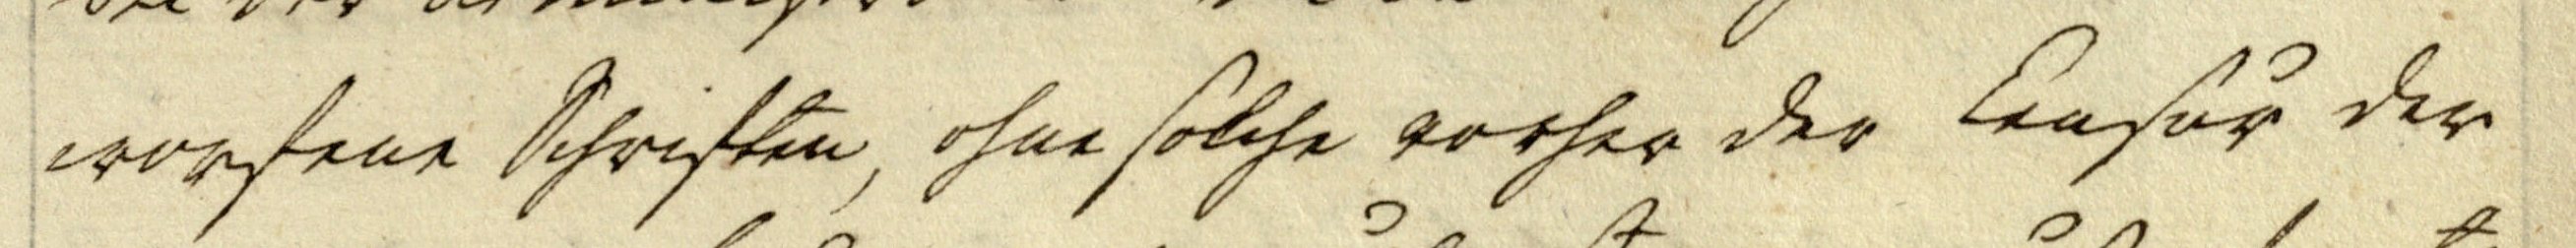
worfene Schriften, ohne solche vorher der Censur der
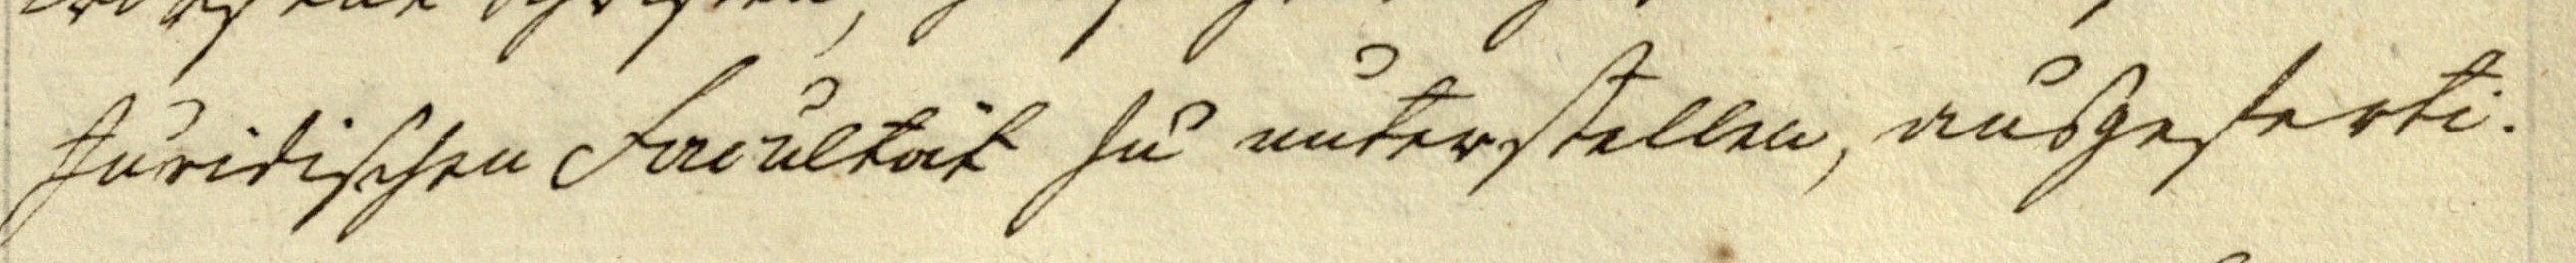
Juridischen Facultät zu unterstellen, ausgeferti¬
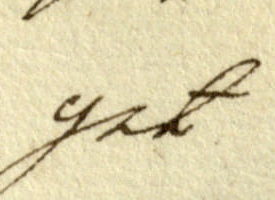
get
